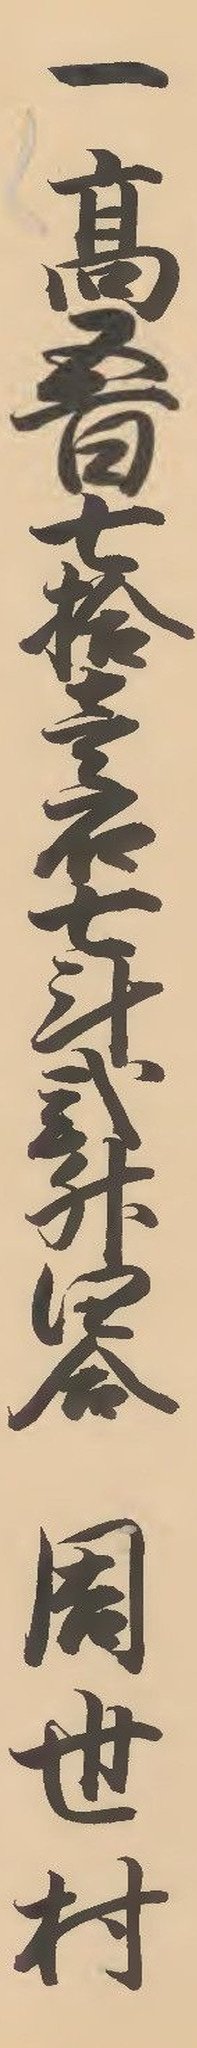一髙五百七拾壱石七斗弐升四合周世村
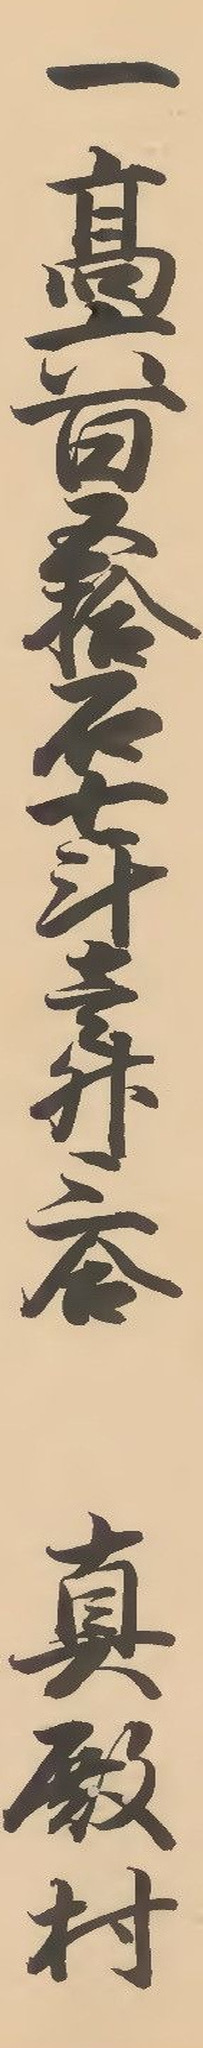一髙六百五拾石七斗壱升三合真殿村
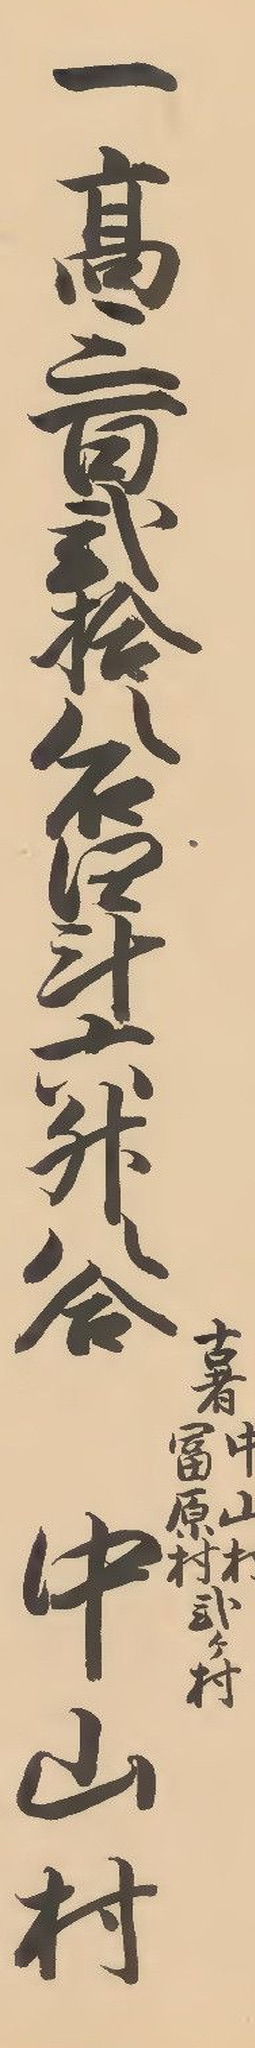一髙三百弐拾八石四斗六升八合中山村
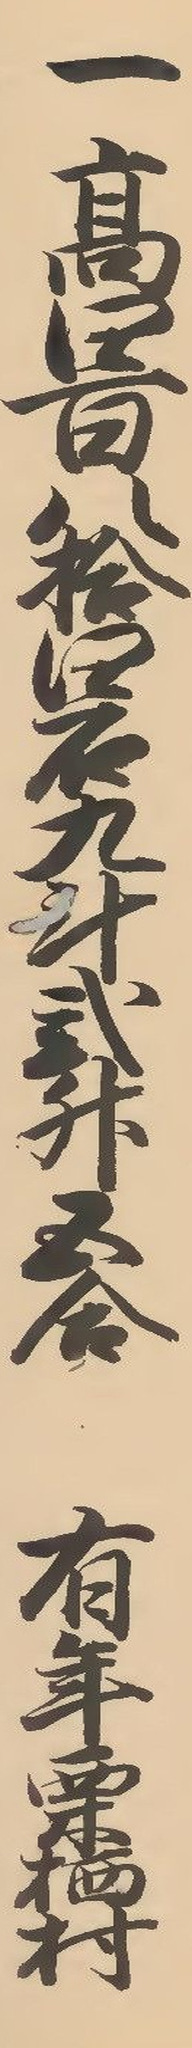一髙四百八拾四石九斗弐升五合有年来栖村
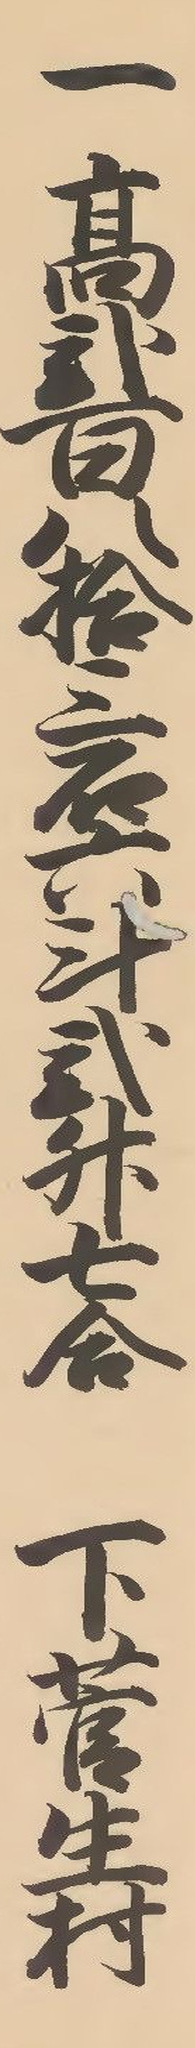一髙弐百八拾三石六斗弐升七合下菅生村
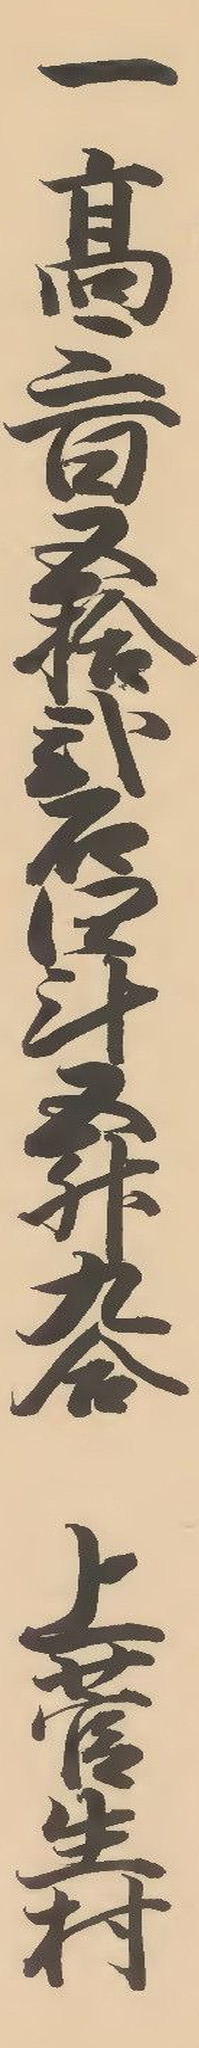一髙三百五拾弐石四斗五升九合上菅生村
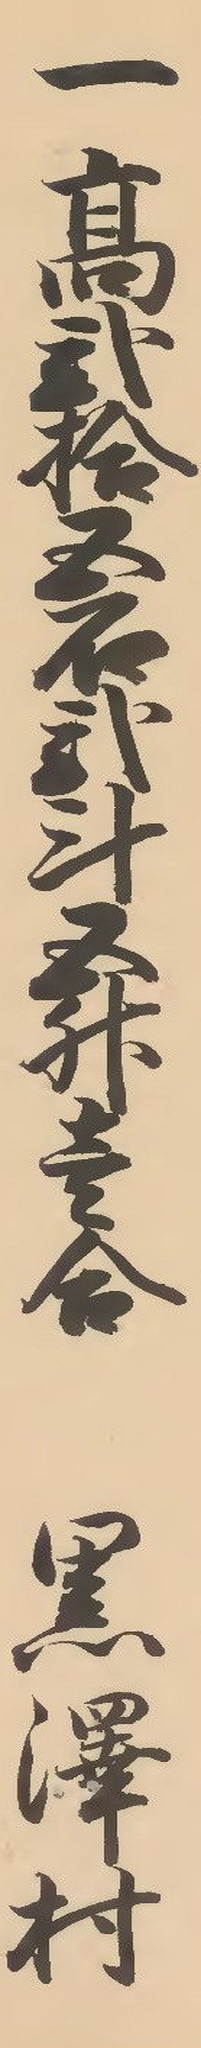一髙弐拾五石弐斗五升壱合黑澤村
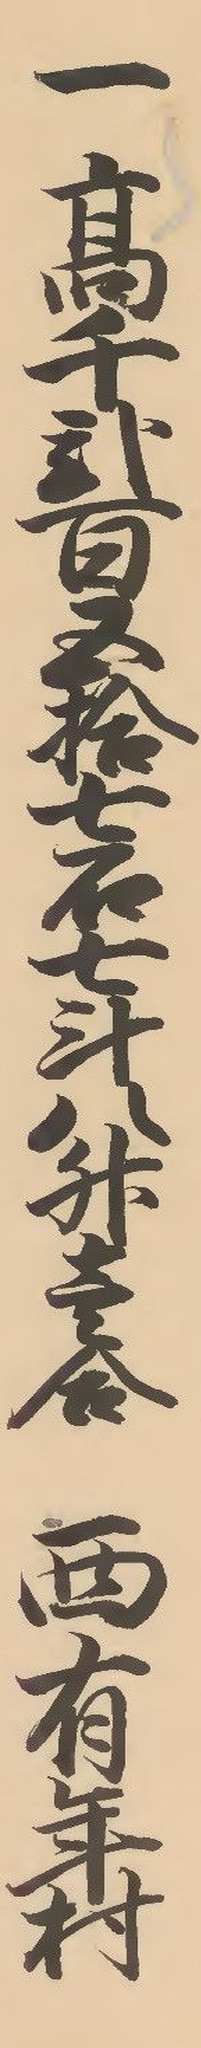一髙千弐百五拾七石七斗八升壱合西有年村

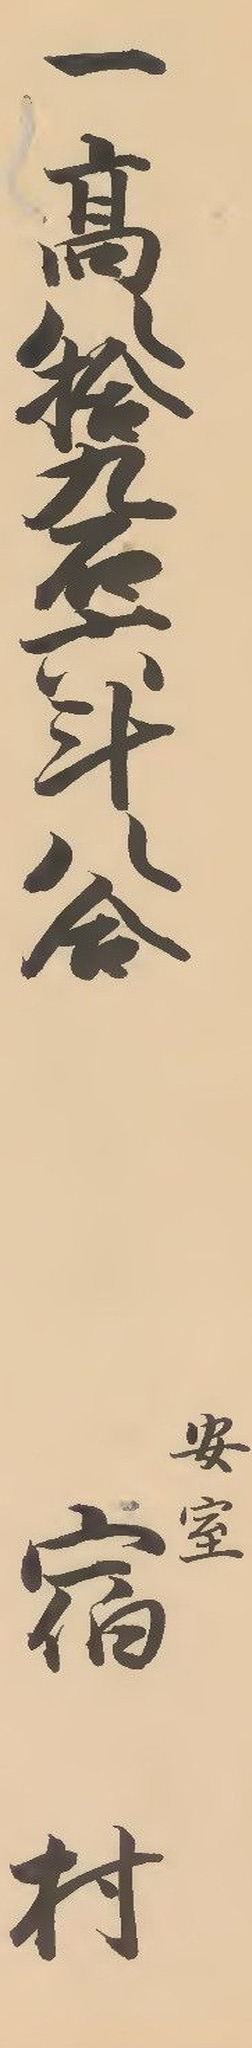一髙八拾九石六斗八合宿村
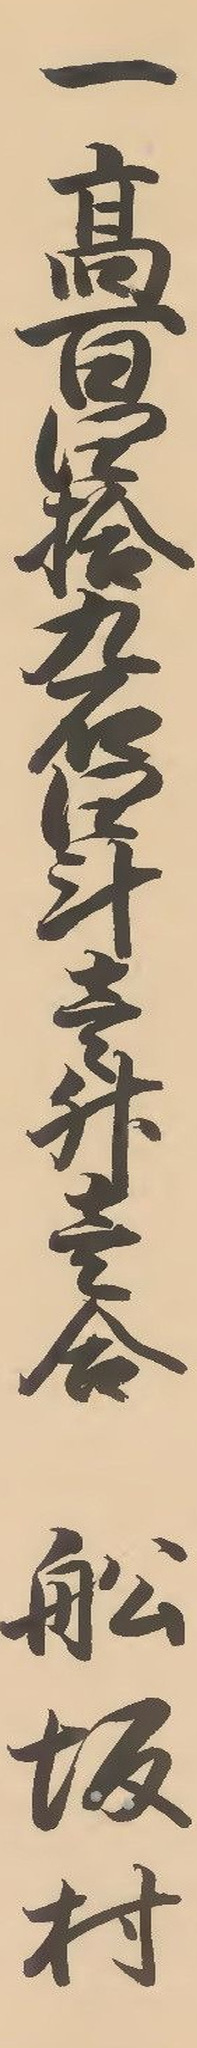一髙百四拾九石四斗壱升壱合舩坂村
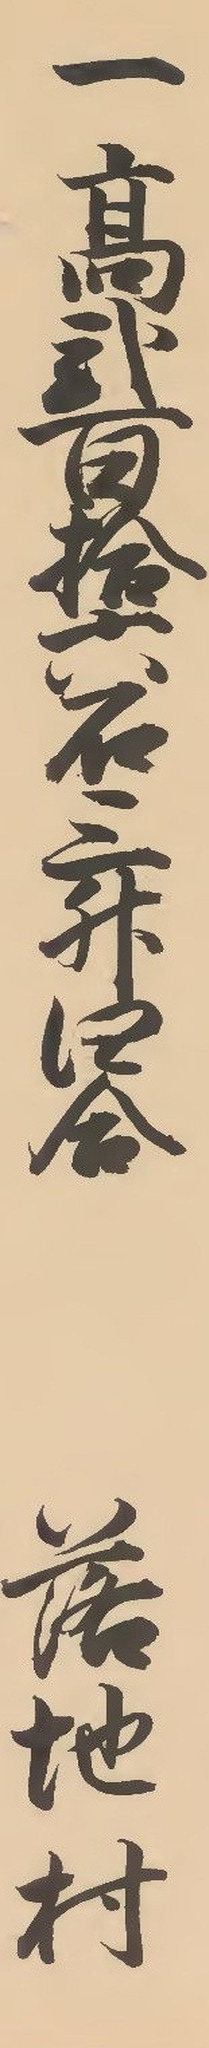一髙弐百拾六石三升四合落地村
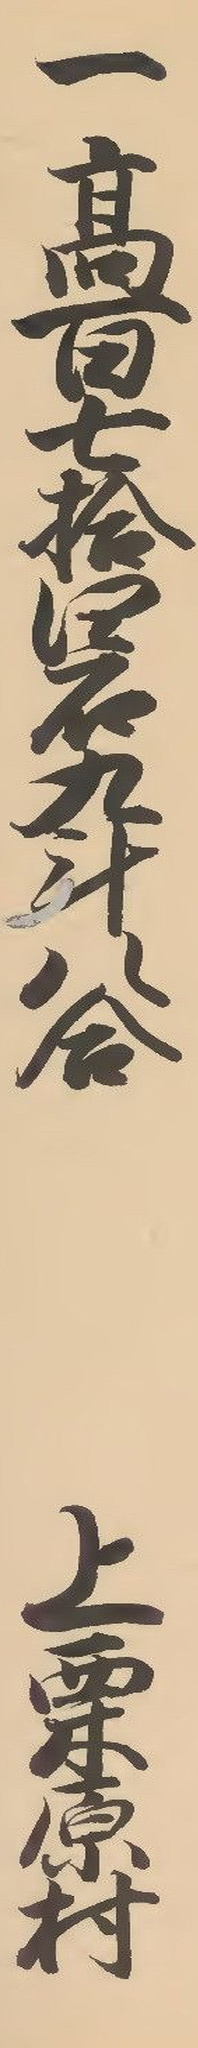一髙百七拾四石九斗八合上栗原村
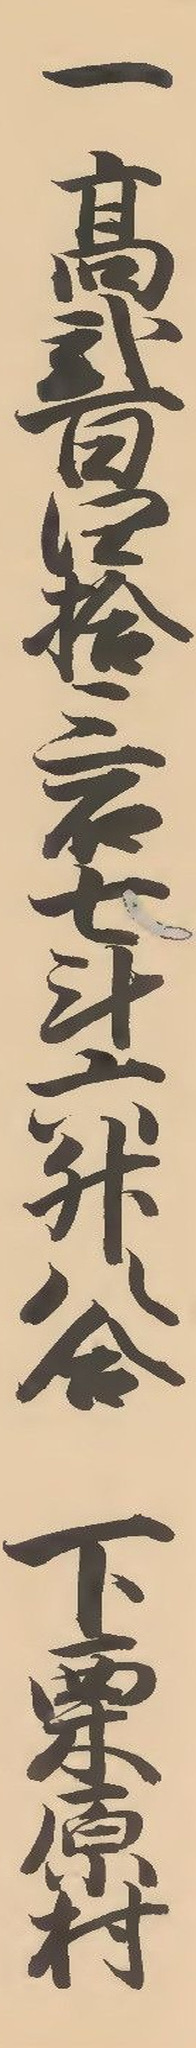一髙弐百四拾三石七斗六升八合下栗原村
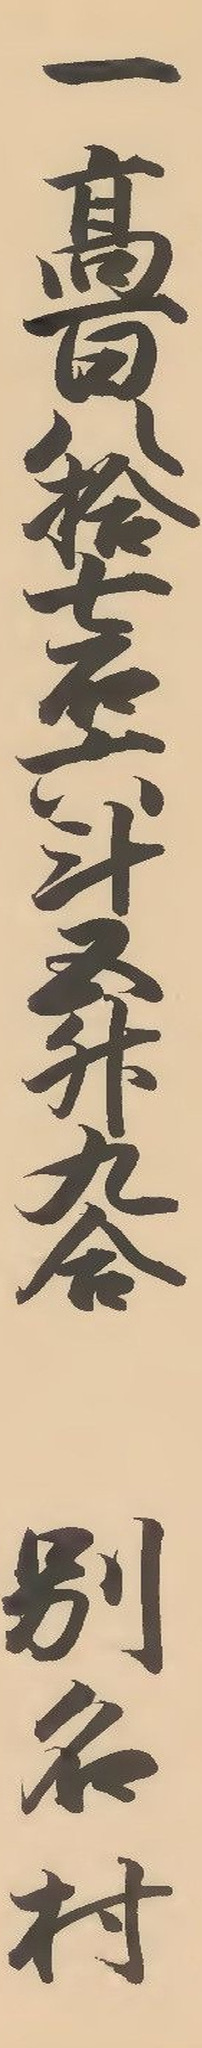一髙百八拾七石六斗五升九合別名村
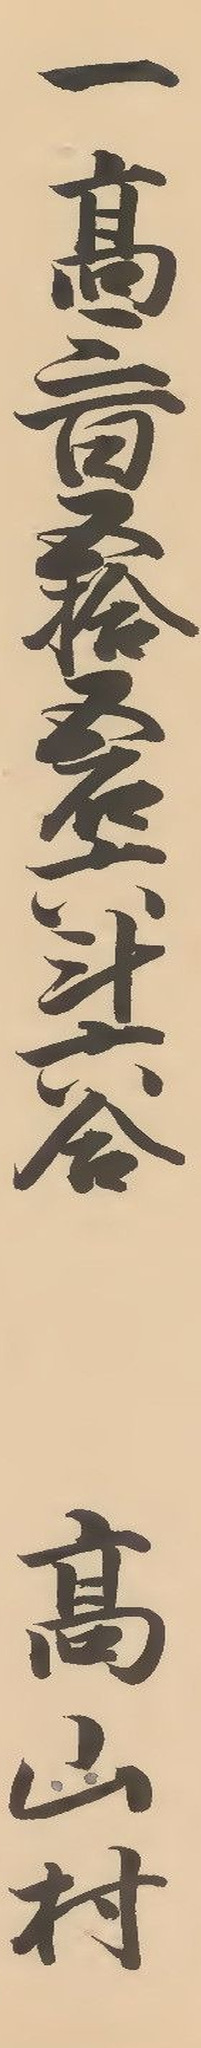一髙三百五拾五石六斗六合髙山村
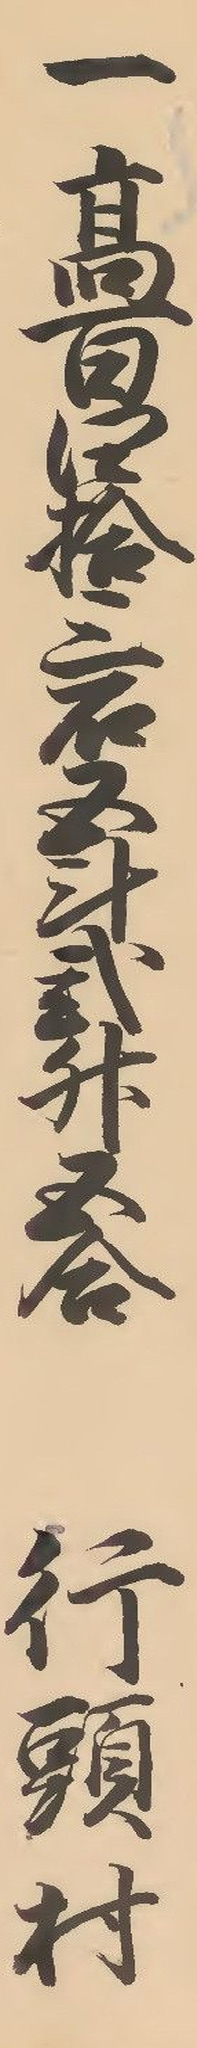一髙百四拾三石五斗弐升五合行頭村
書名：播磨国郷帳
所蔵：国立公文書館 National Archives of Japan
